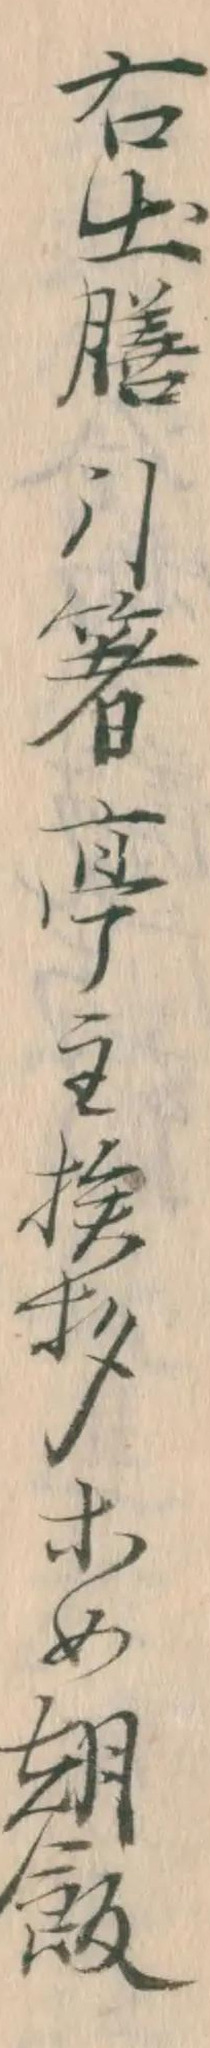右出膳引箸亭主挨拶等如朝飯
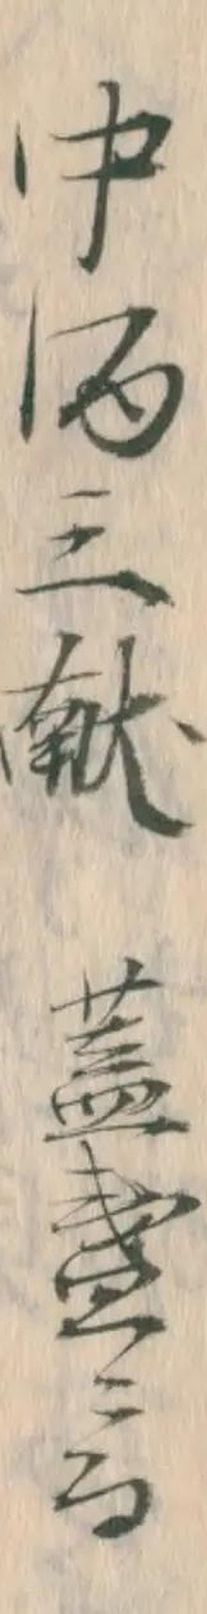中酒三献蓋盞ニ而
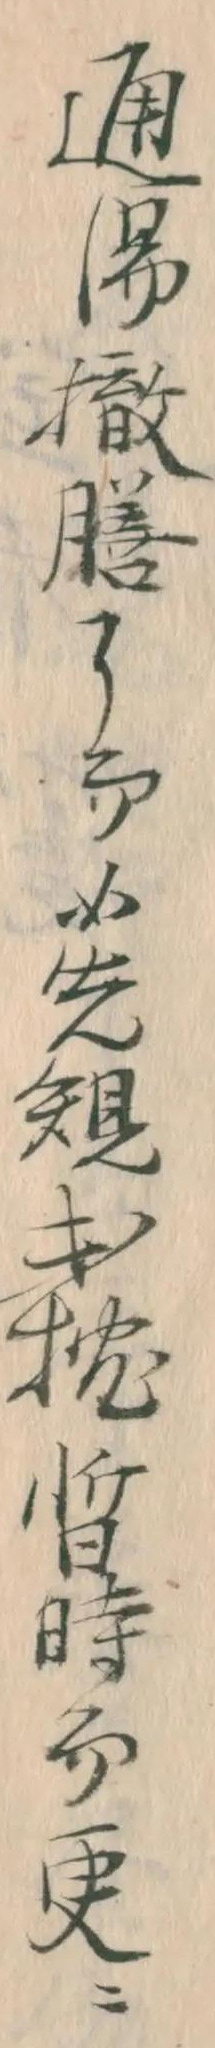通湯撤膳了而如先規出枕暫時而更ニ

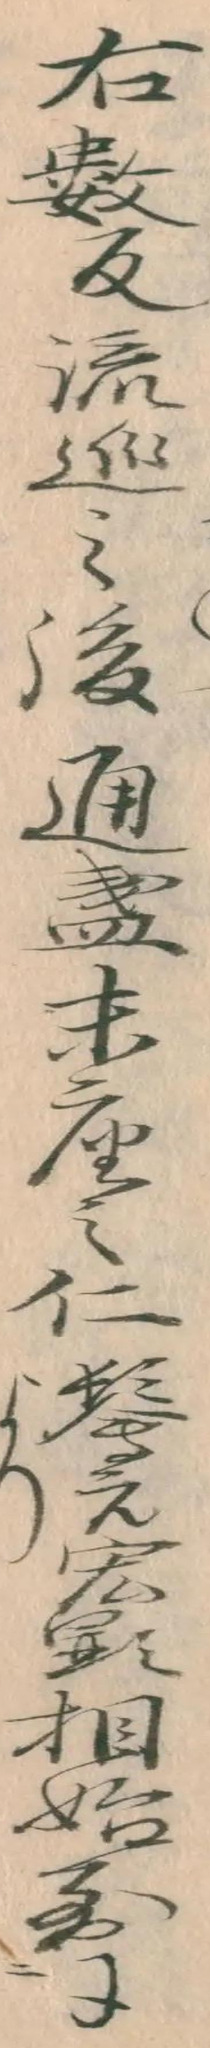右数反流巡之後通盞末座之仁髪元宏顕相始至に
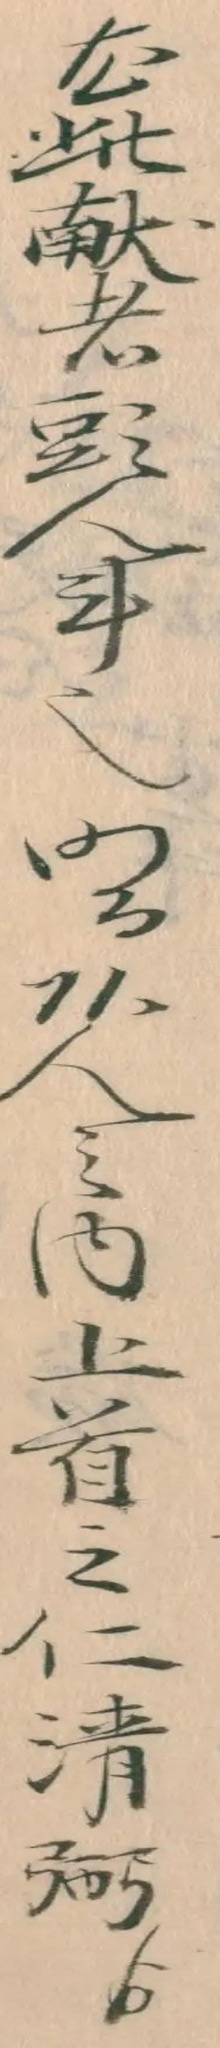尤此献者頭人斗也仍而頭人之内上首之仁清弼ゟ
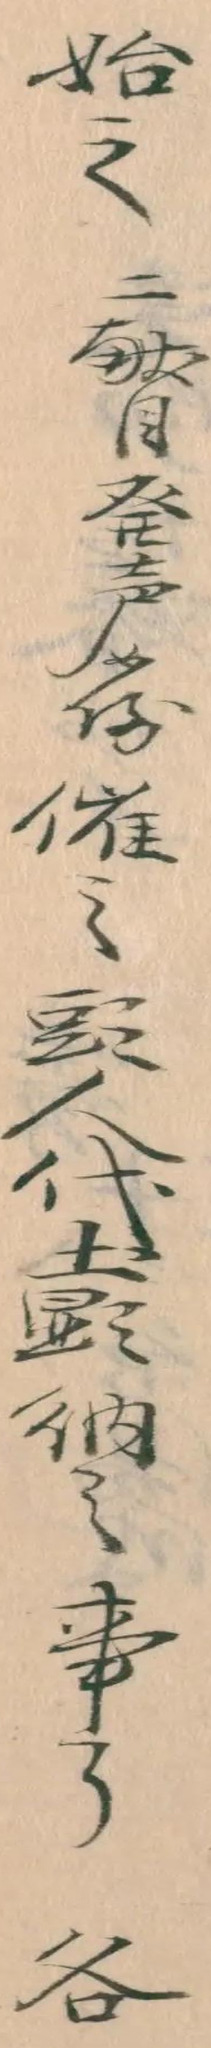始之二献目発声如例催之頭人代土顕納之事了各
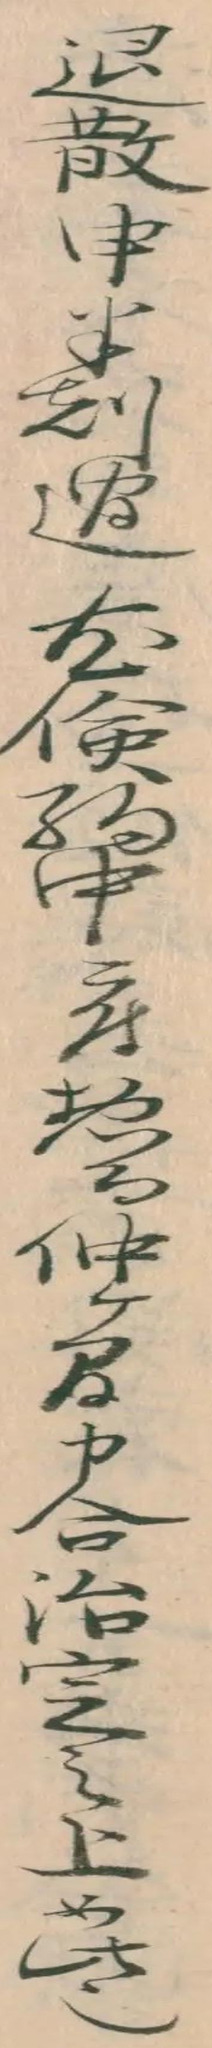退散申半刻過尤倹約中ニ付惣而仲ケ間申合治定之上如此也
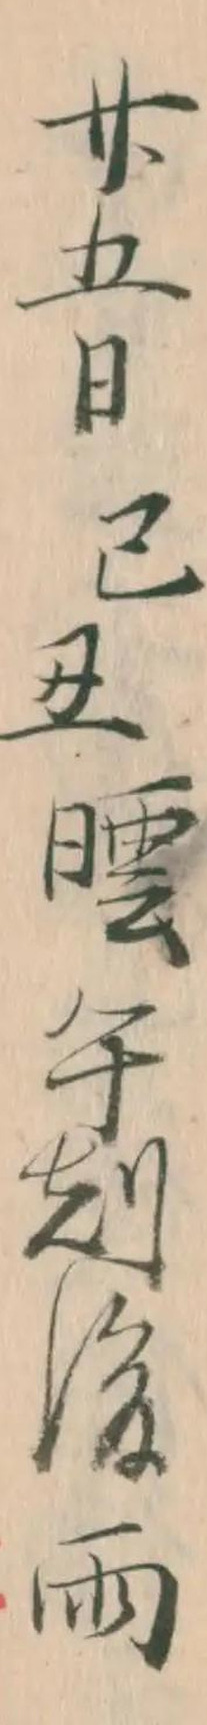廿五日己丑曇午刻後雨
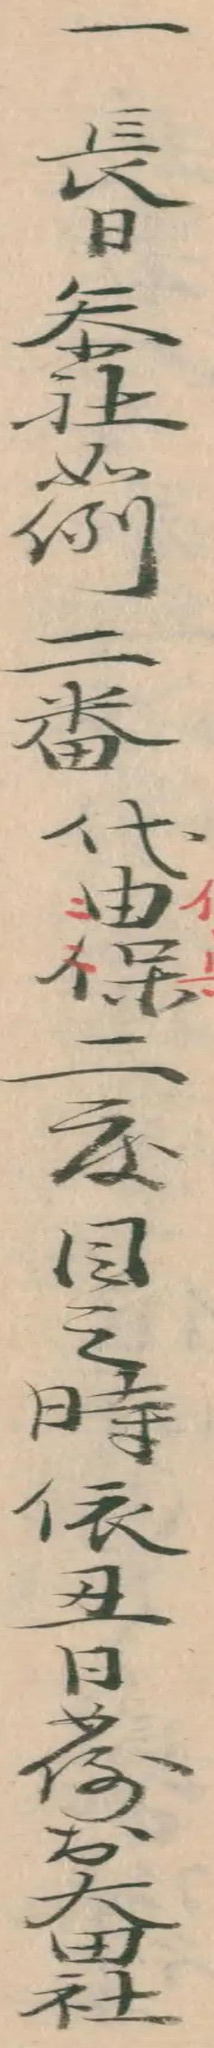一長日参社如例二番代由保二度目之時依丑日如例於大田社
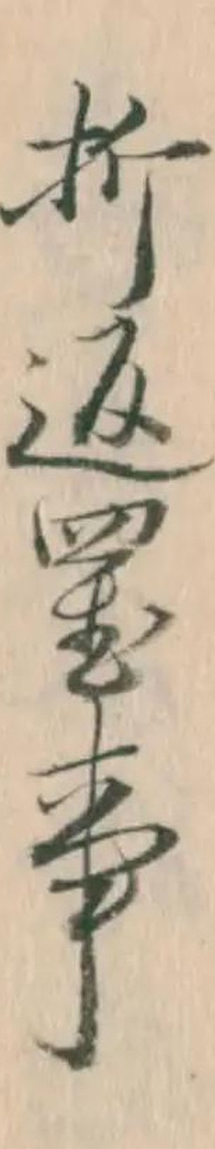折返置事
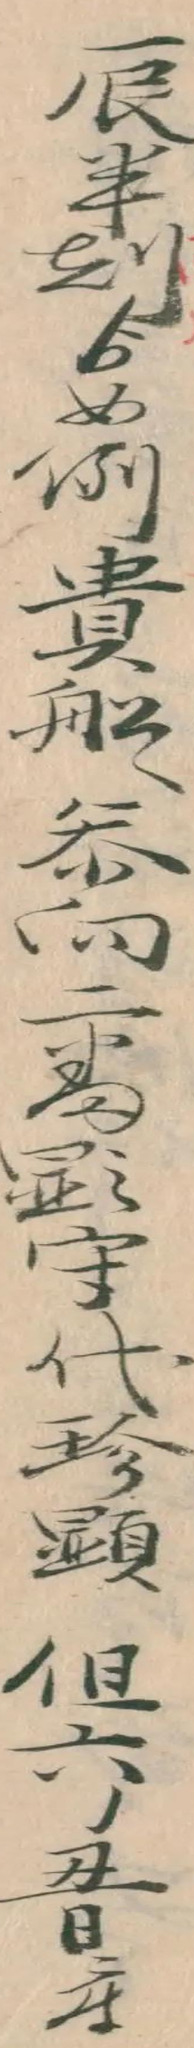一辰半刻ゟ如例貴舩へ参向二番顕守代珍顕但六ノ丑日ニ付
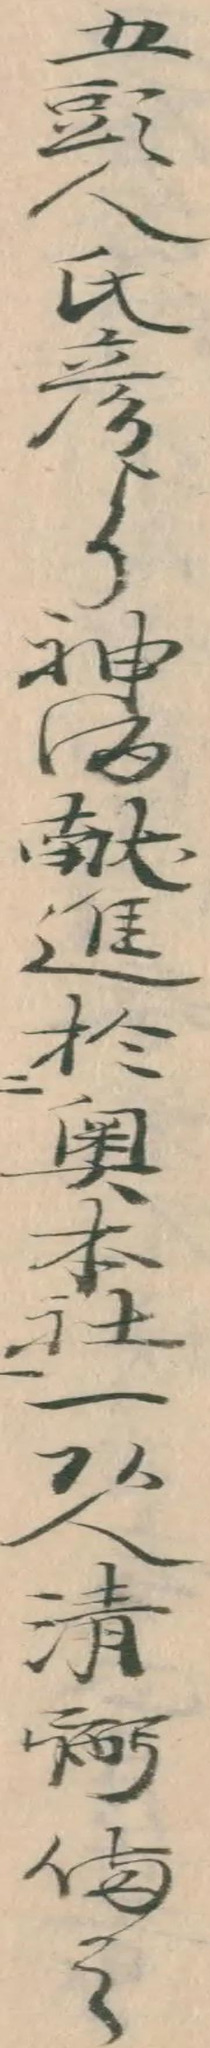五頭人氏彦より神酒献進於奥本社一頭人清弼備之
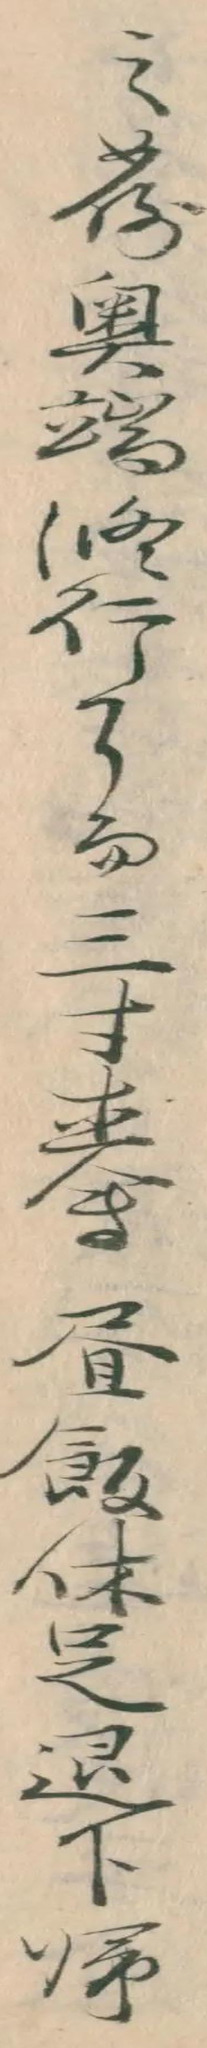之如例奥端修行了而三寸直會昼飯休足退下帰
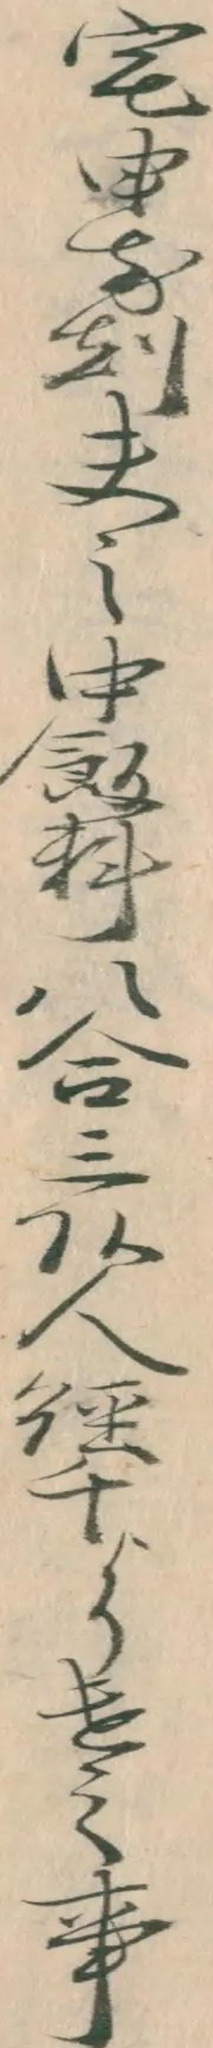宅申前刻夫之中飯料八合三頭人経千より遣之事
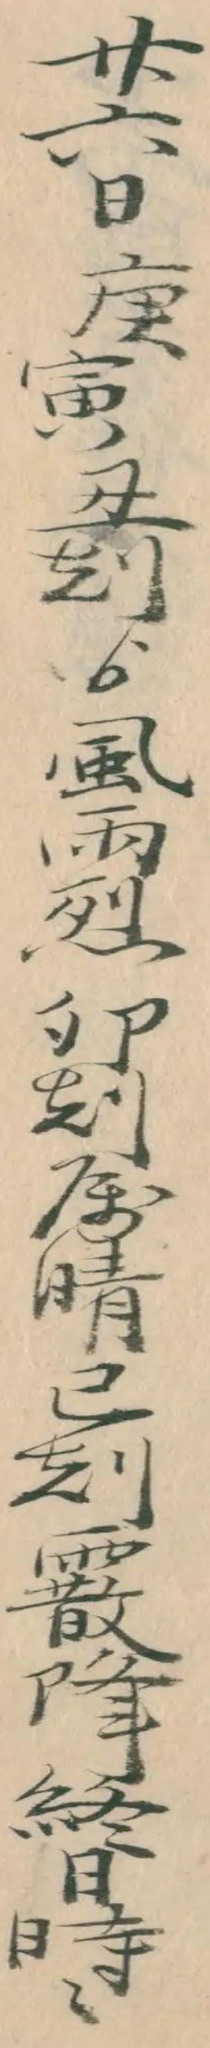廿六日庚寅丑刻ゟ風雨烈卯刻属晴巳刻霰降終日時々

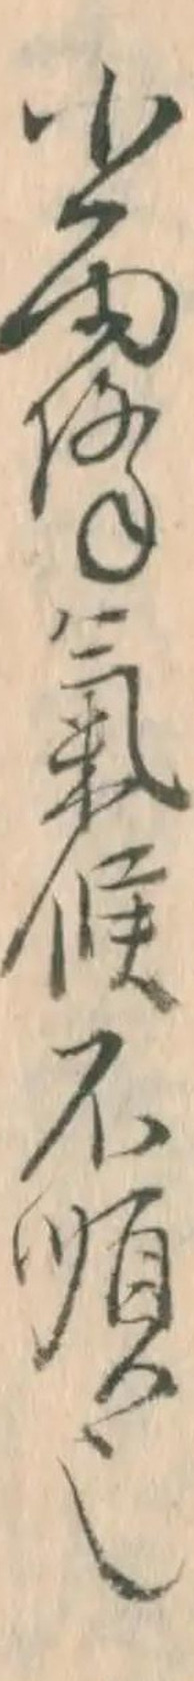小雨降氣候不順也
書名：賀茂社記録. 第73冊
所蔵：国立国会図書館 National Diet Library, JAPAN
